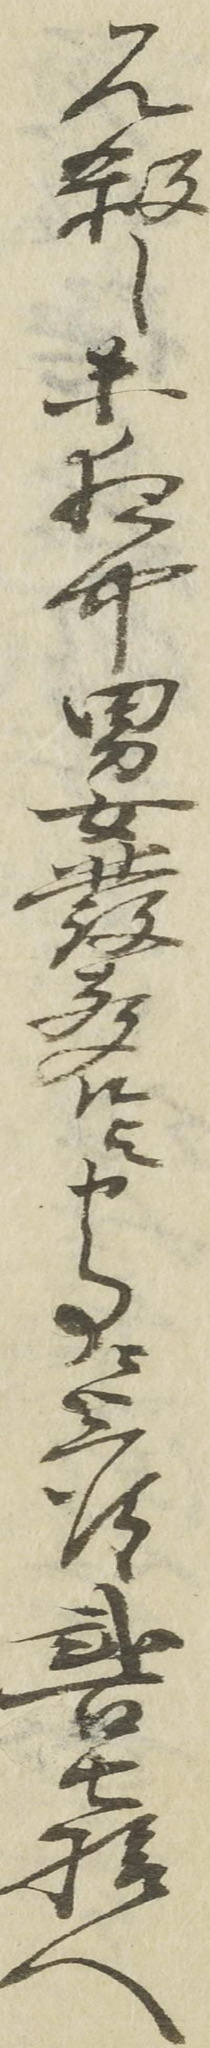見殺し未夜中男女発声候と申事ニ御座候弐百七拾人
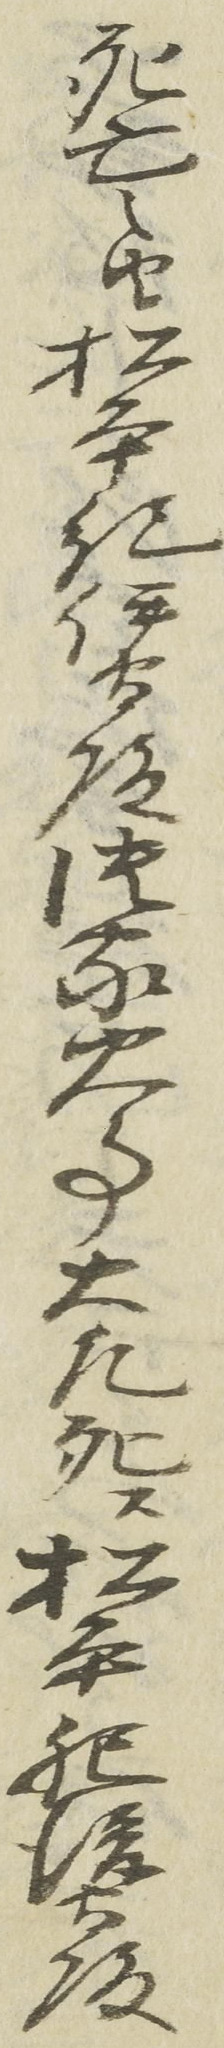死亡之由松平紀伊守殿潰家火事大凡死ス松平肥後守殿
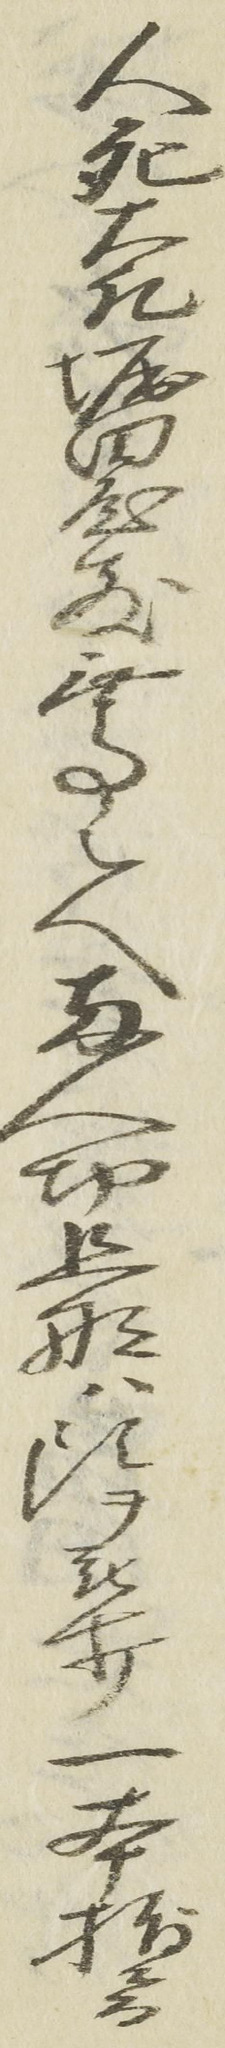人死大凡堀田屋敷無事之人両人切旦那ハ頭ヲ被打一本指ニ而
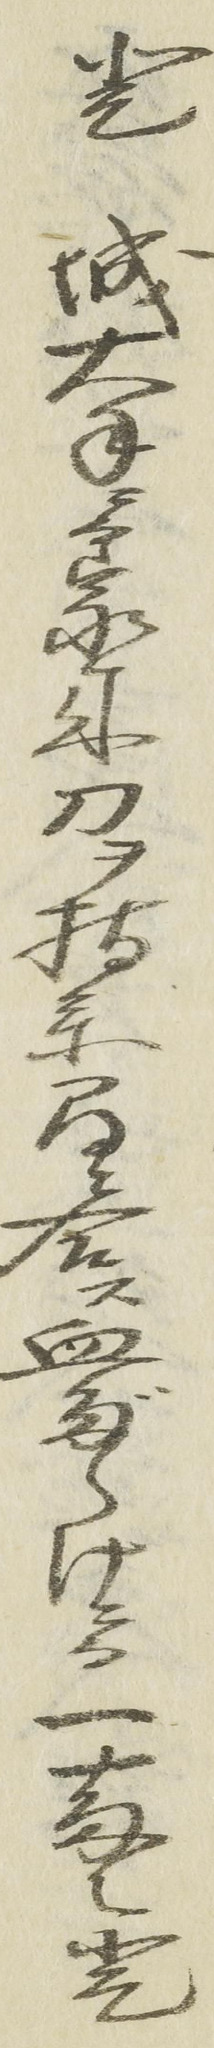登城大手二而家来刀ヲ持参間二合ス血だらけ二而一番之登
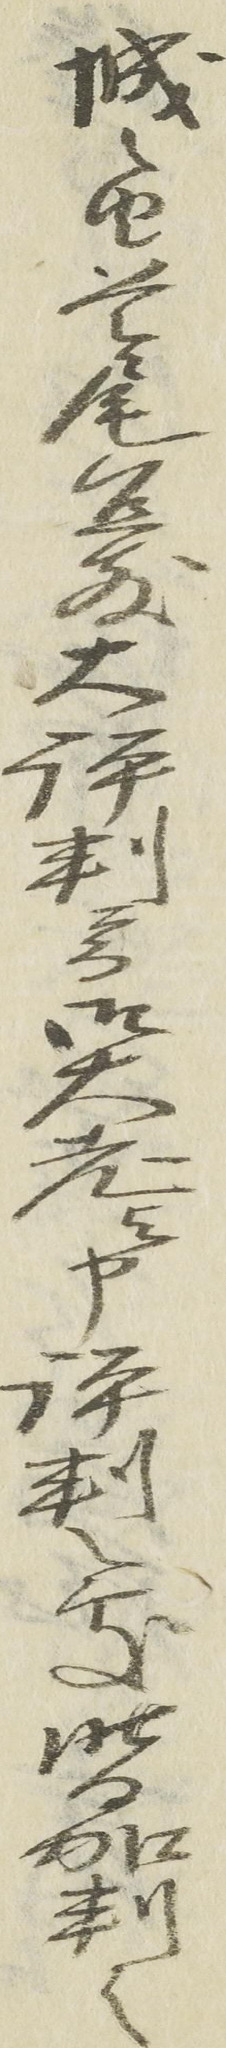城之由首尾宜敷大評判二而御大老と申評判之処昨日加判之
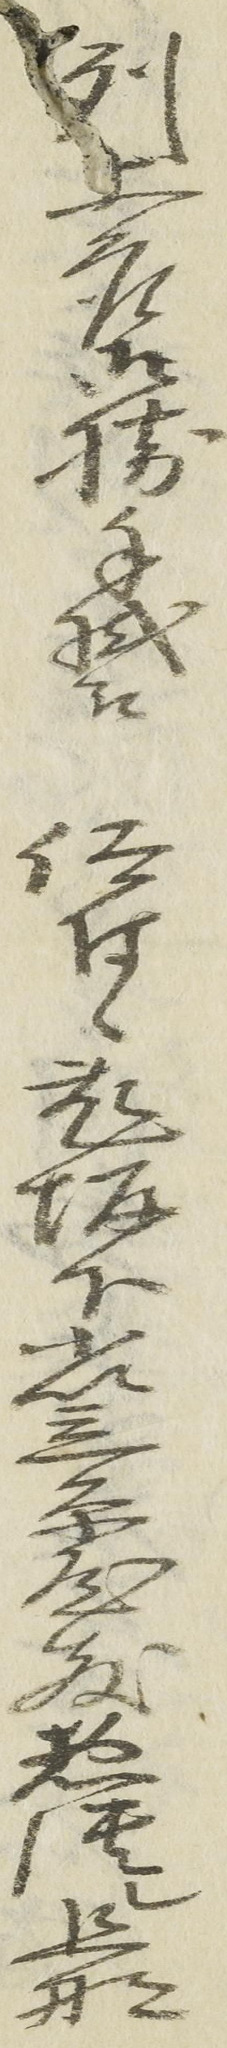列上坐御勝手掛被仰付候趣坂下小笠原屋敷惣潰レ旦那
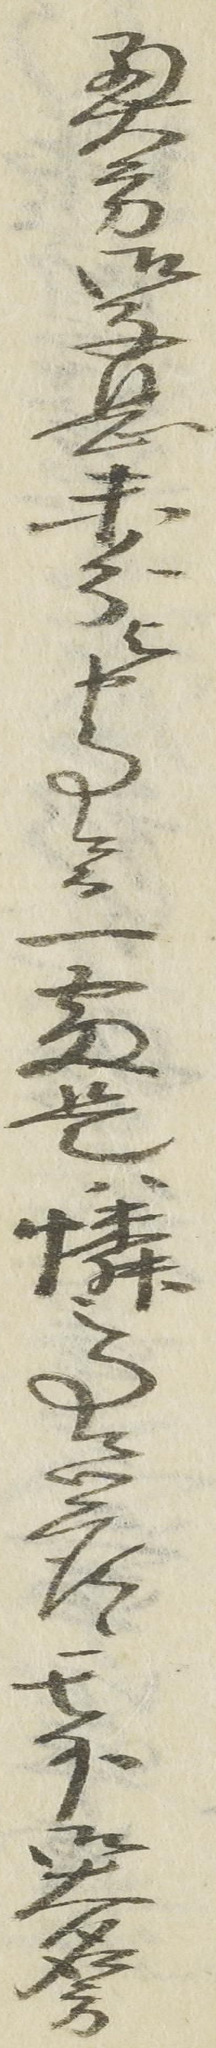奥方御子息未分と申事二而一番是ハ憐之事二御座候其外御大名方
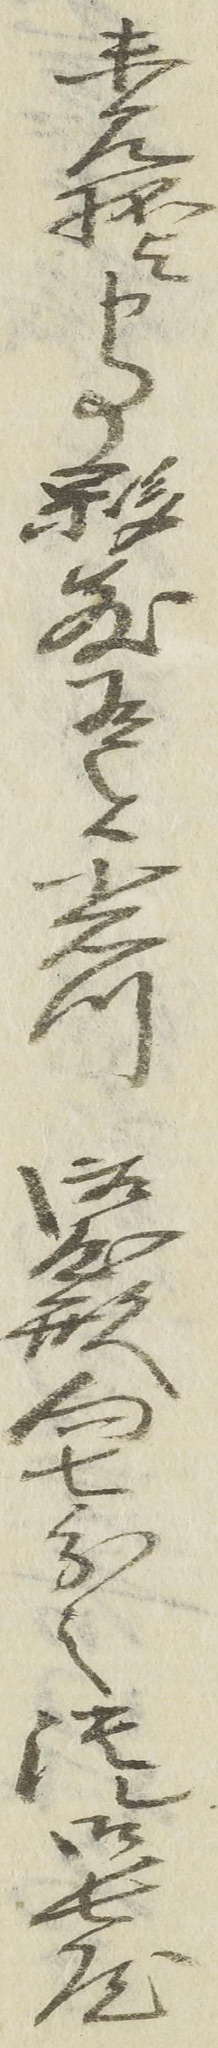未見抔と申事夥敷有之小石川御屋形向七分之潰レ御長屋
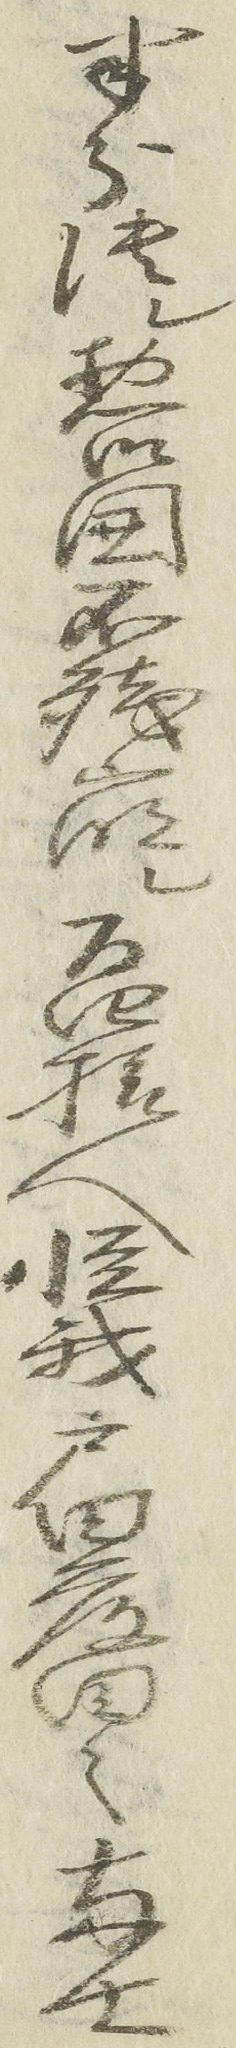半分潰レ惣御囲不残崩レ百四拾人怪我戸田広田之両士
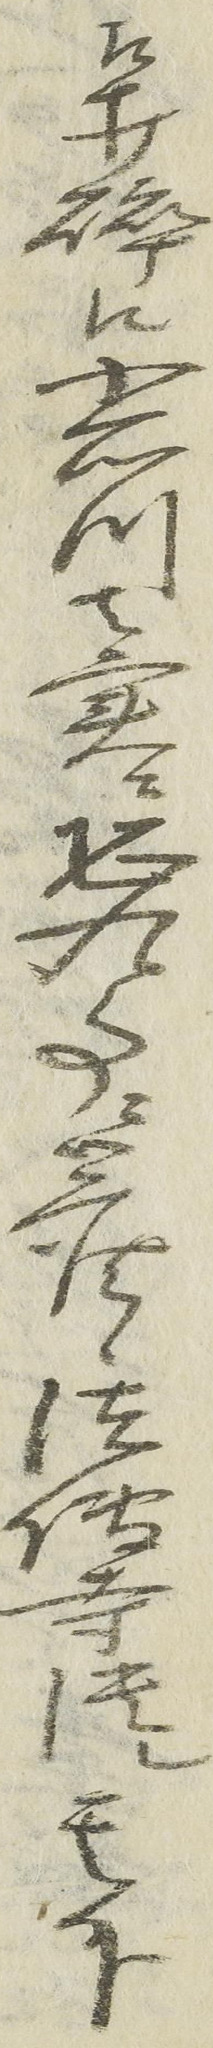被打碎候小石川は実二恐敷事二御座候法伝寺潰レ其外
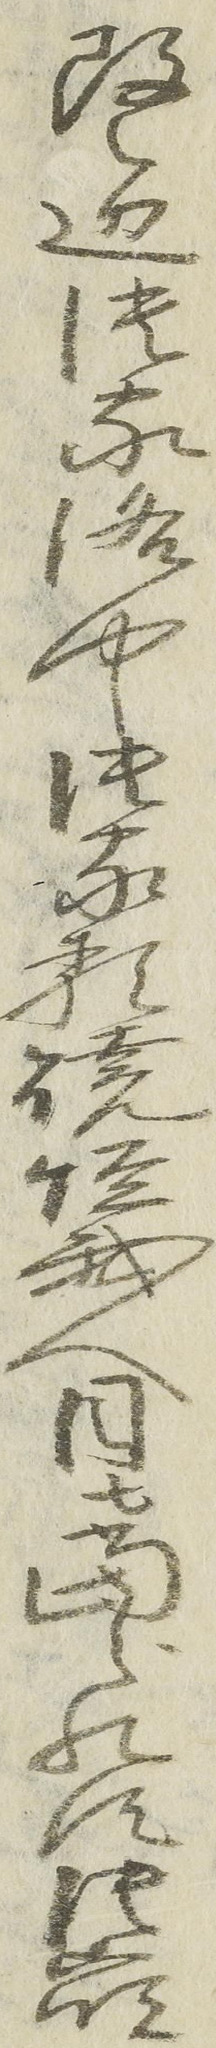改候辺潰家洛中潰家類焼怪我人目も当られす潰崩

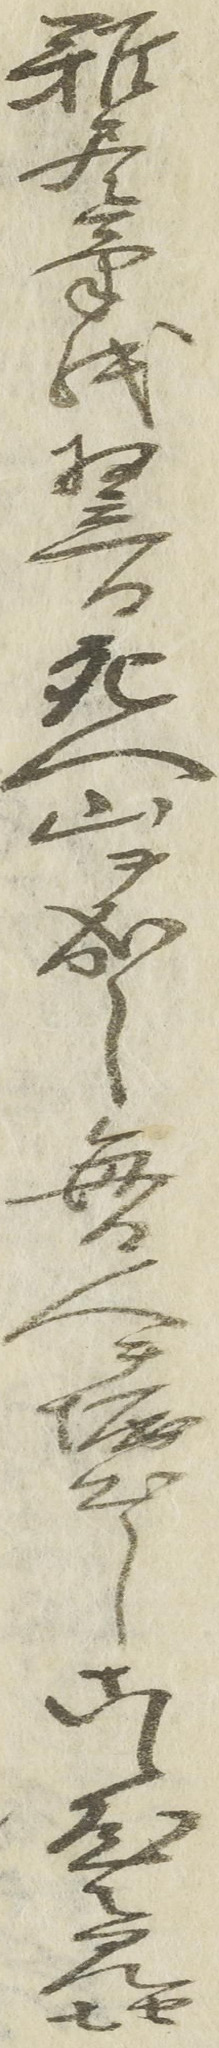難尽筆紙翌日死人山ヲ成し毎日人を掘出しこ屋之見セは
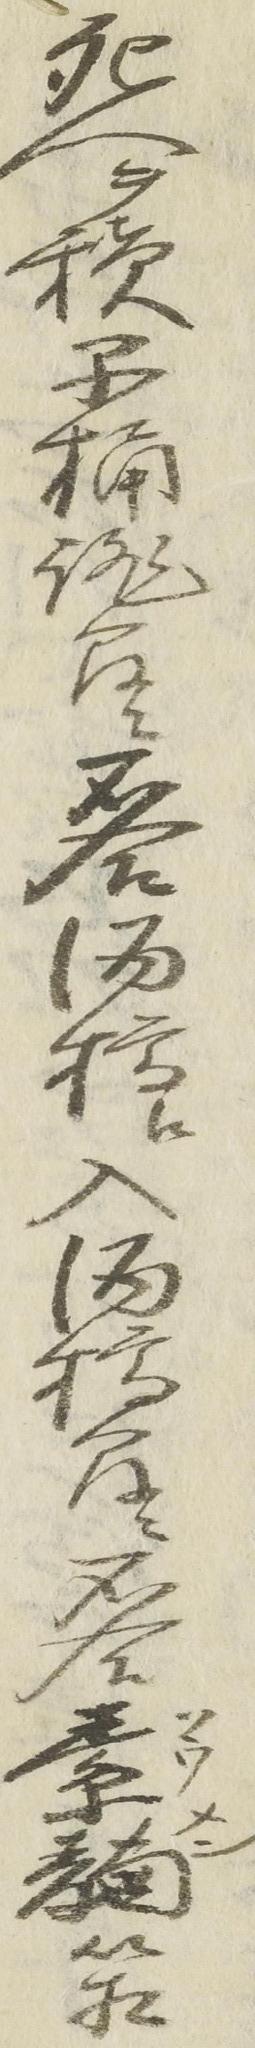死人ヲ積早桶誂間二不合酒樽江入酒樽間二不合素麺箱
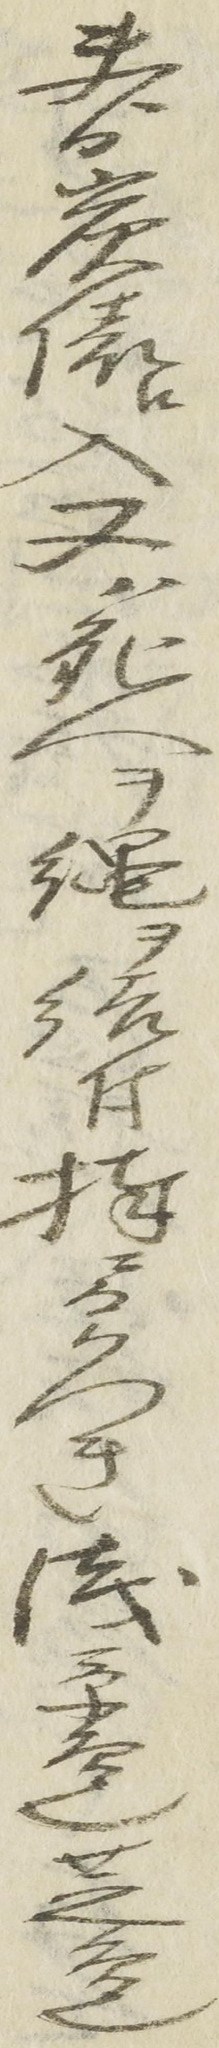夫ゟ炭俵江入又ハ死人ヲ縄ヲ結付棒ニ而かつき浅草辺芝辺
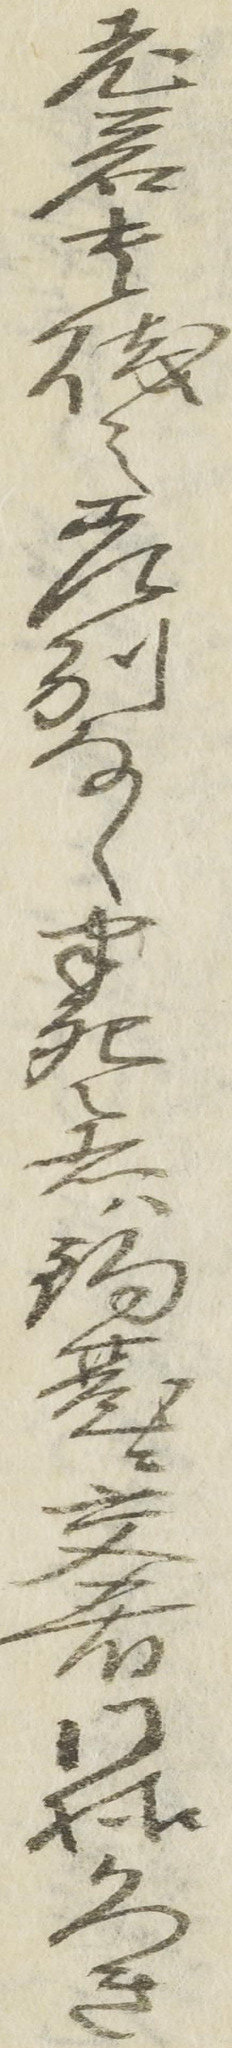老若貴賤之差別なく半死之者ハ鉤䑓に交肴同様かつき
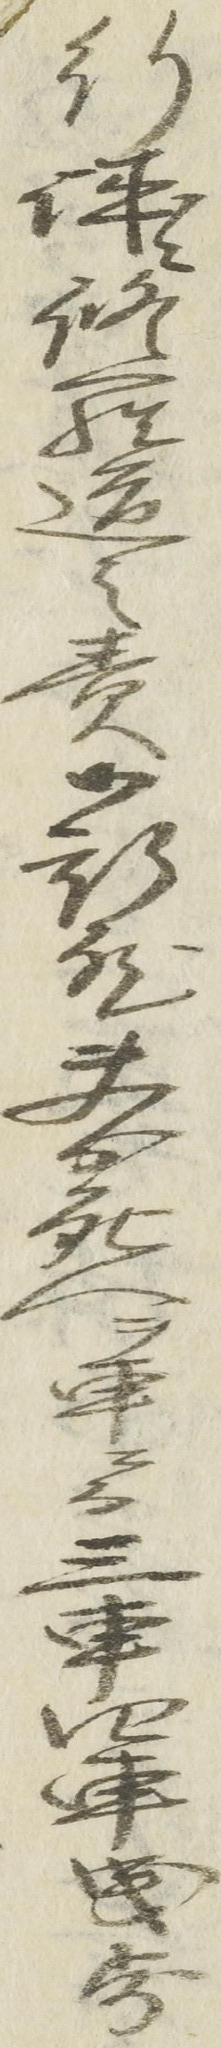行誠ニ修羅道之責如斯歟夫ゟ死人ヲ車ニ而三車四車曳歩
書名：安政乙卯江戸大地震筆記　安政丙辰八月大阪大雷雨之記追加　安政三辰年七月松前辺大地震并八月大風雨記録
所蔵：東京大学地震研究所図書室 Earthquake Research Institute Library, The University of Tokyo, JAPAN
